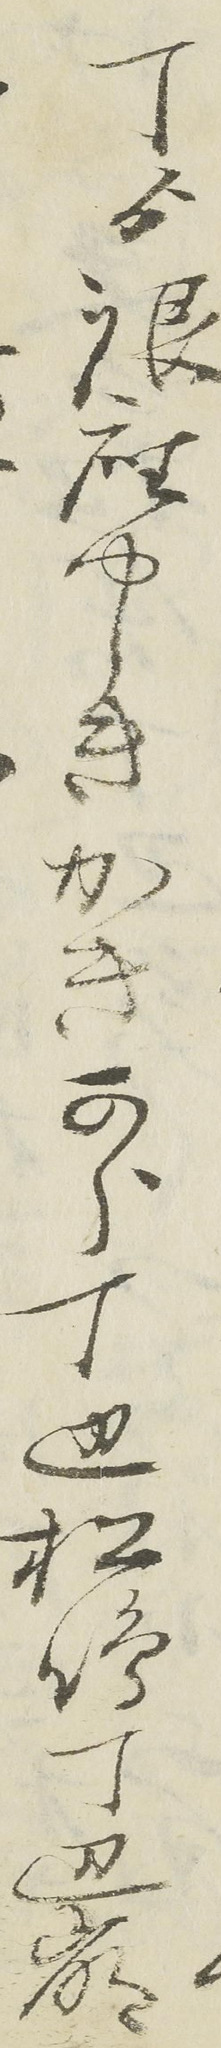丁ゟ銀座ゆきかきから丁辺松嶋丁辺崩
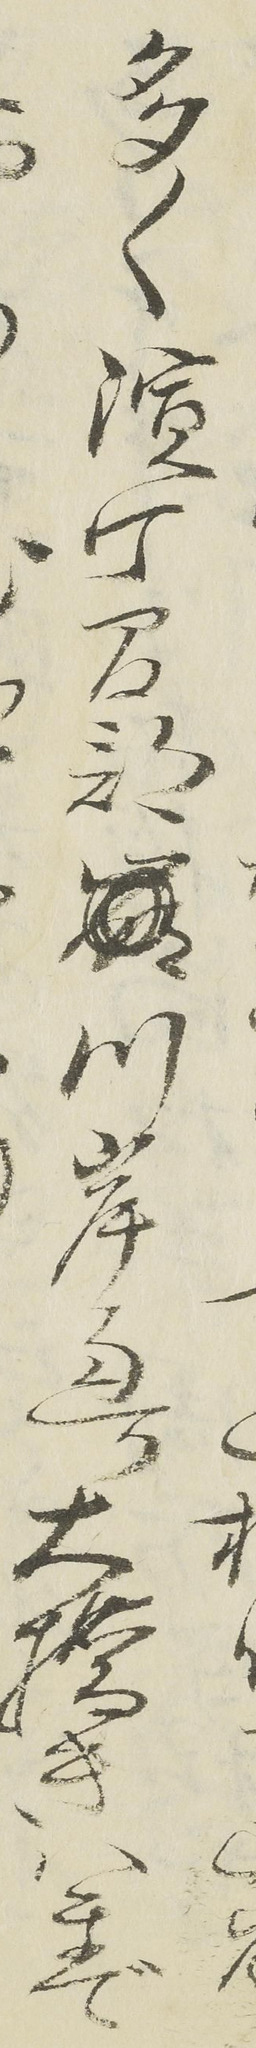多く濱丁間部川岸通り大橋きハまで
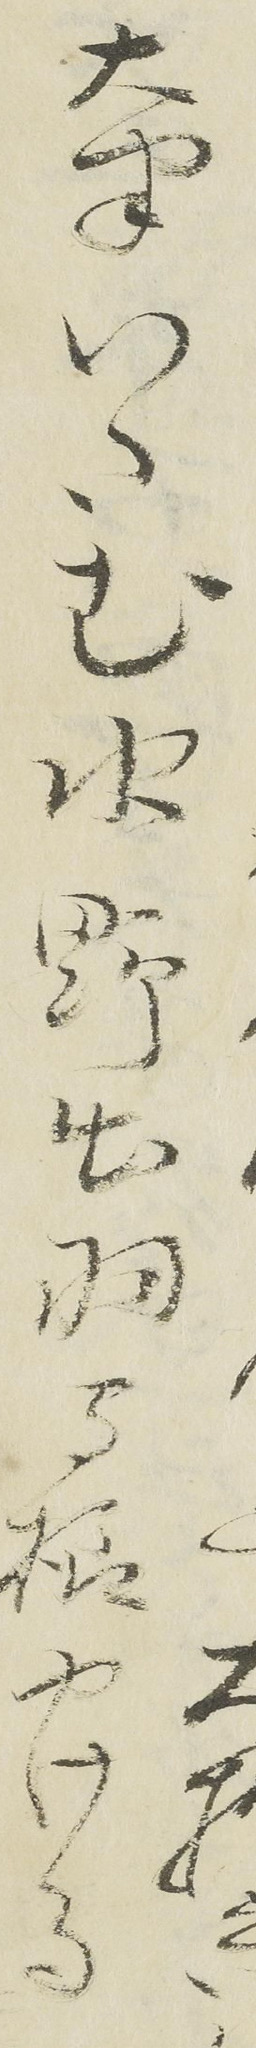大半いたむ水野出羽守様やける

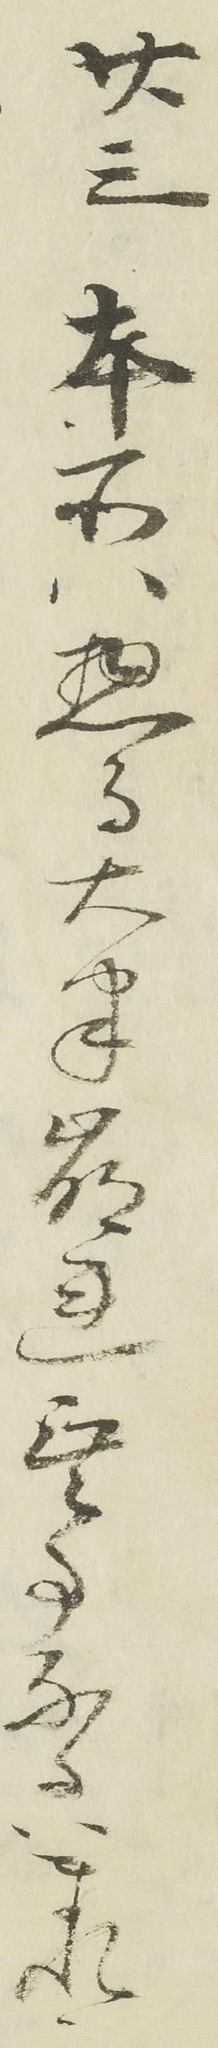廿三本所ハ惣而大半崩れ無事なるハまれ
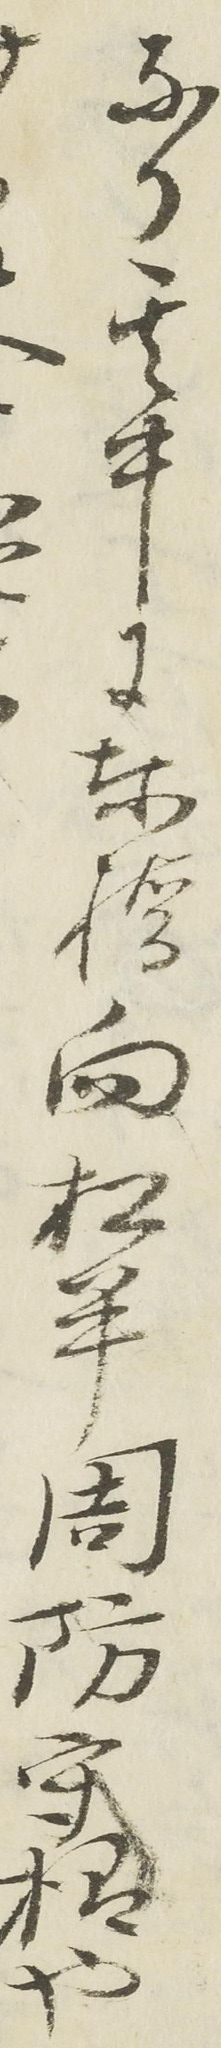なり其中に東橋向松平周防守様や
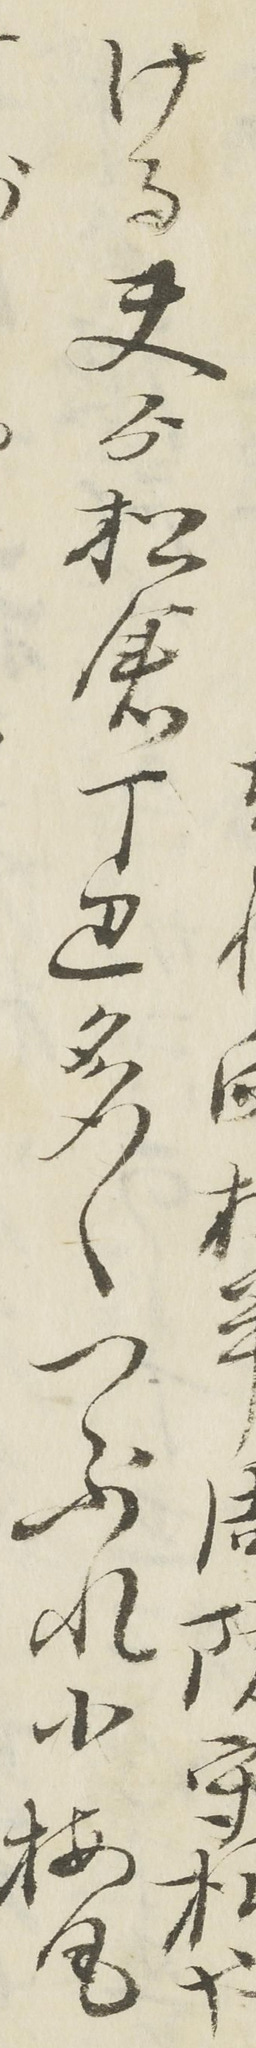ける夫ゟ松倉丁辺多くつぶれ小梅尾
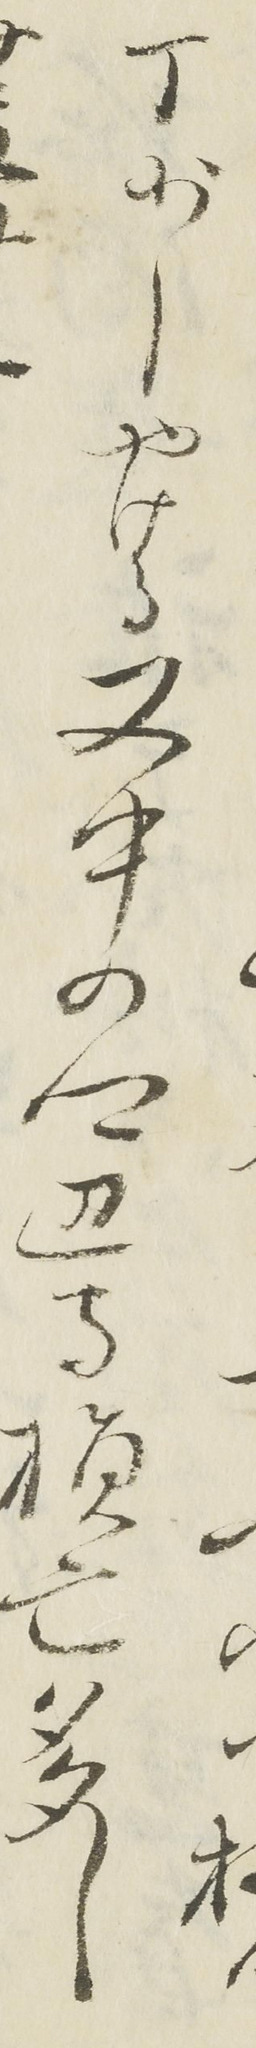丁少しやける又中の郷辺寺損亡多し
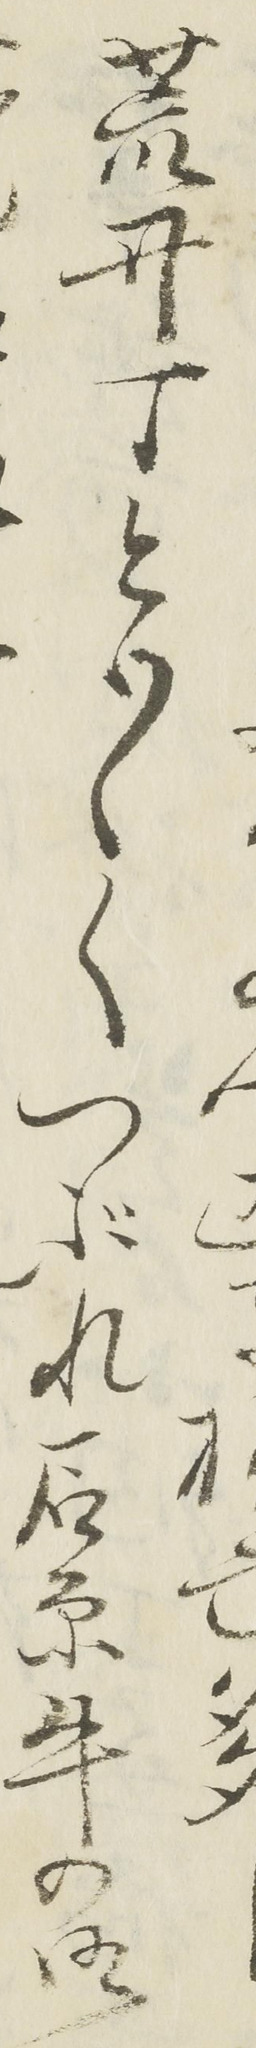荒井丁こと〴〵くつぶれ石原牛の御
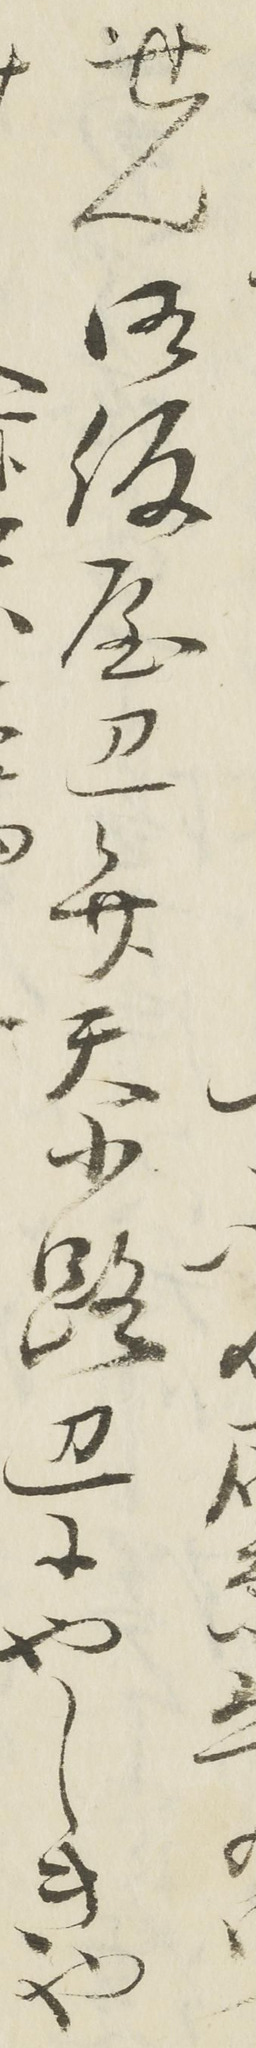せん御仮屋辺弁天小路辺小やしきや
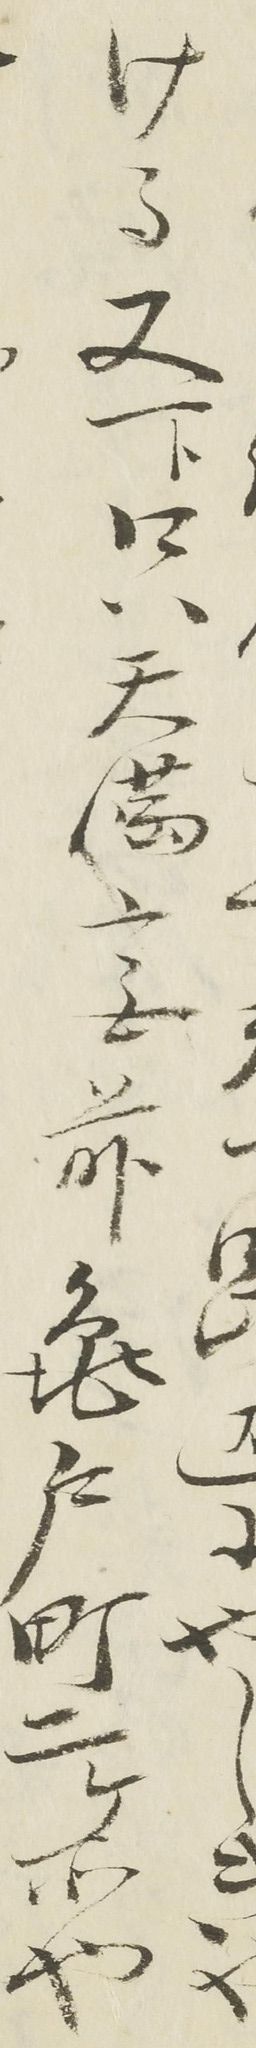ける又下口ハ天満宮前亀戸町二ケ所や
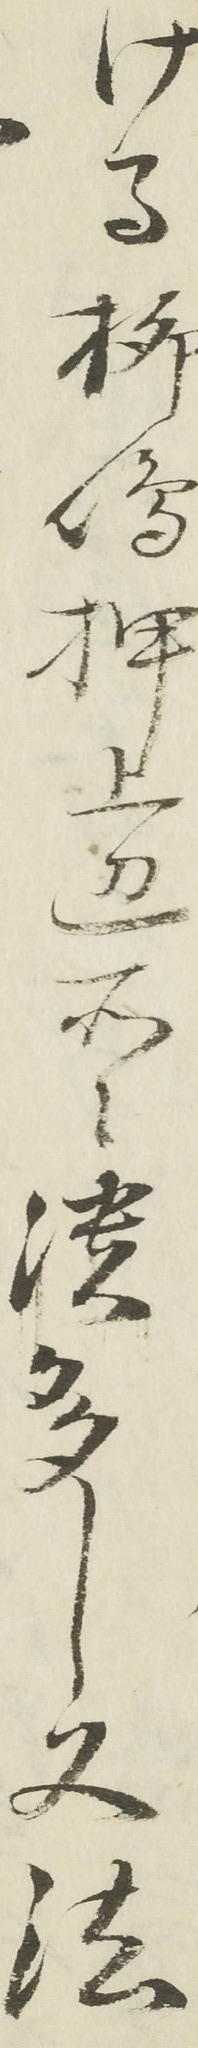ける柳嶋押上辺所〻潰多し又法
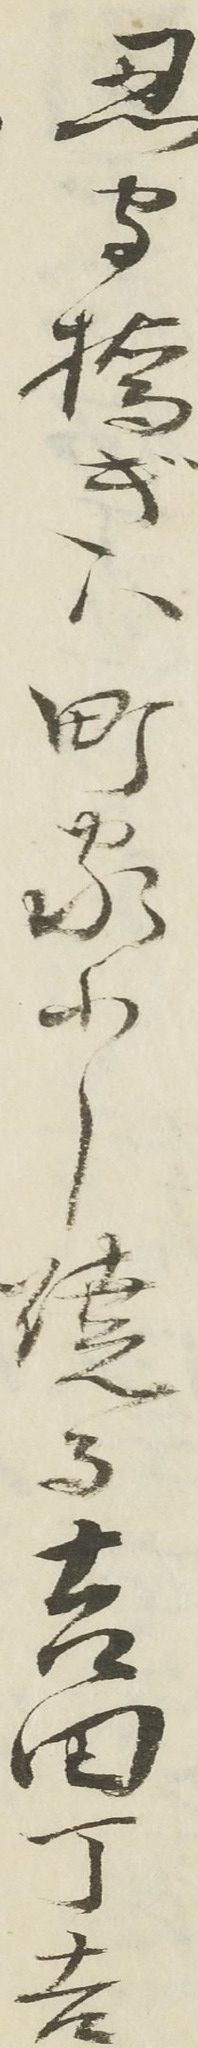忍寺橋ぎハ町家少し焼る吉田丁吉
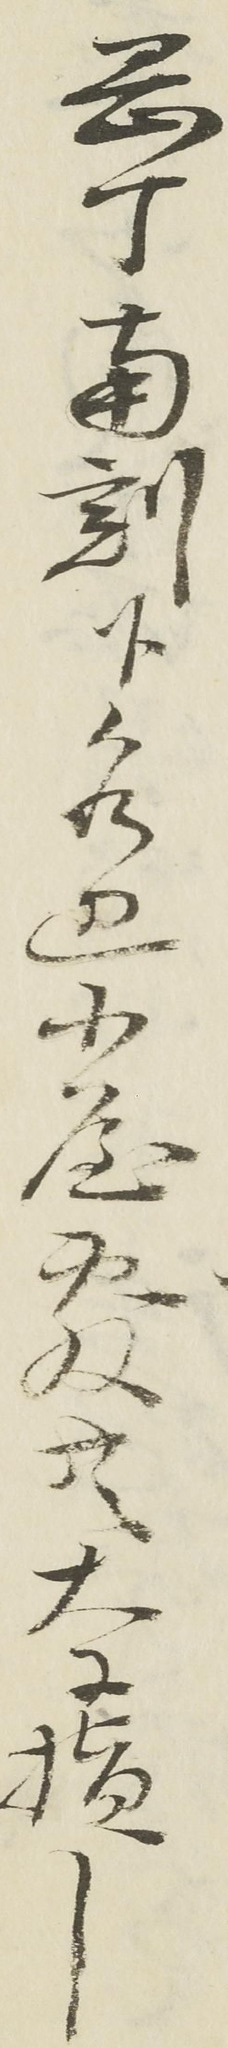岡丁南割下ケ水辺小屋敷共大ニ損し
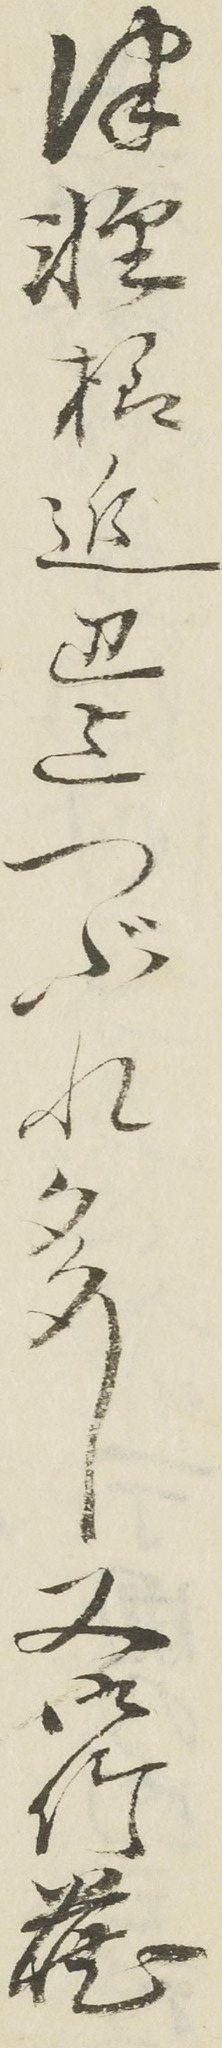津軽様近辺迄つぶれ多し又御竹蔵
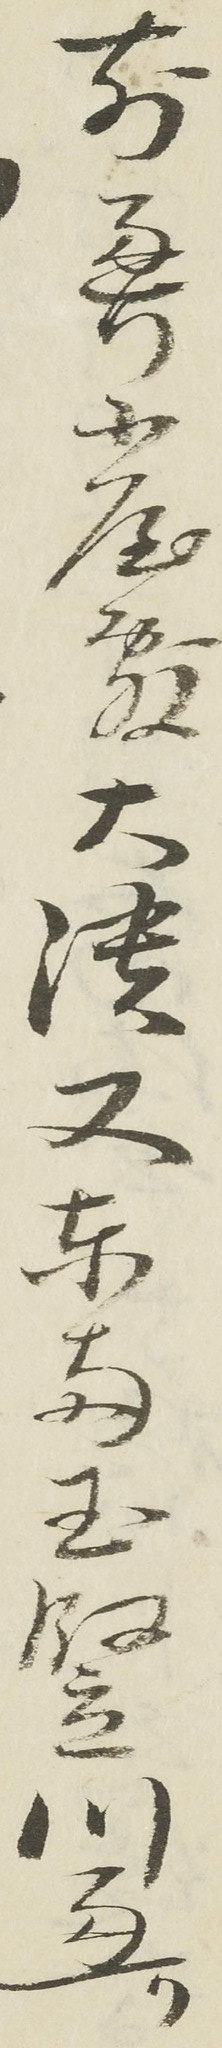前通り小屋敷大潰又東南玉堅川通り
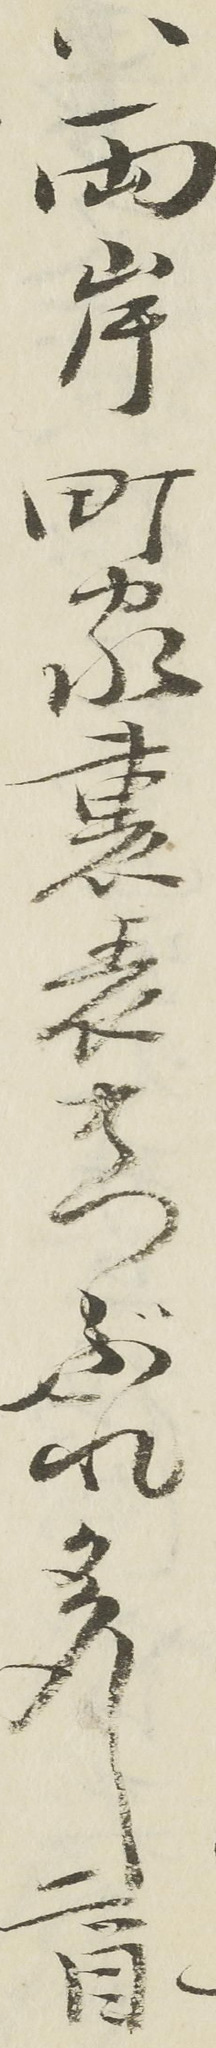ハ両岸町家裏表共つぶれ多し二ツ目
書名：安政乙卯江戸大地震筆記　安政丙辰八月大阪大雷雨之記追加　安政三辰年七月松前辺大地震并八月大風雨記録
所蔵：東京大学地震研究所図書室 Earthquake Research Institute Library, The University of Tokyo, JAPAN
